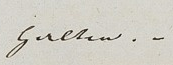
halten. –
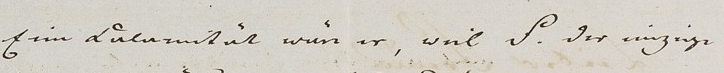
Eine Calamität wäre es, weil F. der einzige
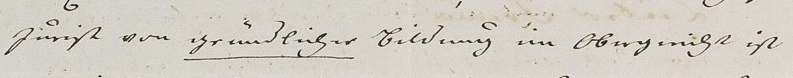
Jurist von gründlicher Bildung im Obergericht ist
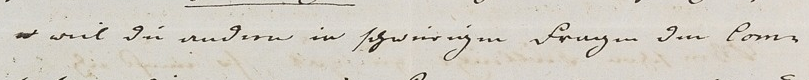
u weil die andern in schwierigen Fragen den Com-
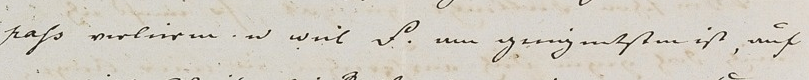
pass verlieren – u weil F. am geeignetsten ist, auf
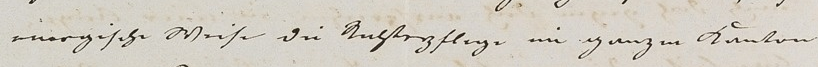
energische Weise die Rechtspflege im ganzen Kanton
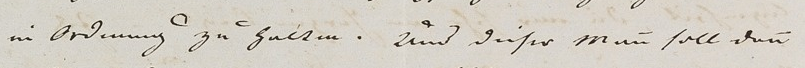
in Ordnung zu halten. Und dieser Mann soll dann
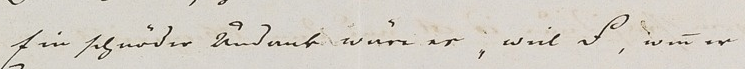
Ein schnöder Undank wäre es, weil F., wenn er
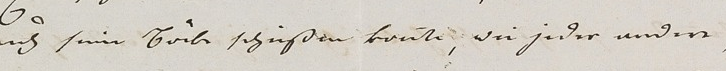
auch seine Böcke schießen konnte, wie jeder andere,
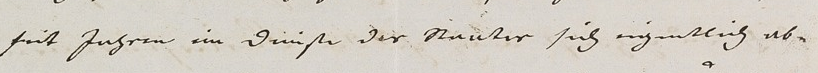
seit Jahren im Dienste des Staates sich eigentlich ab-
